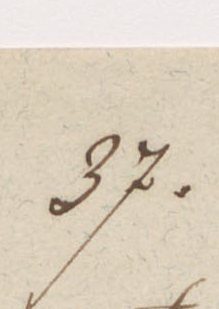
37.
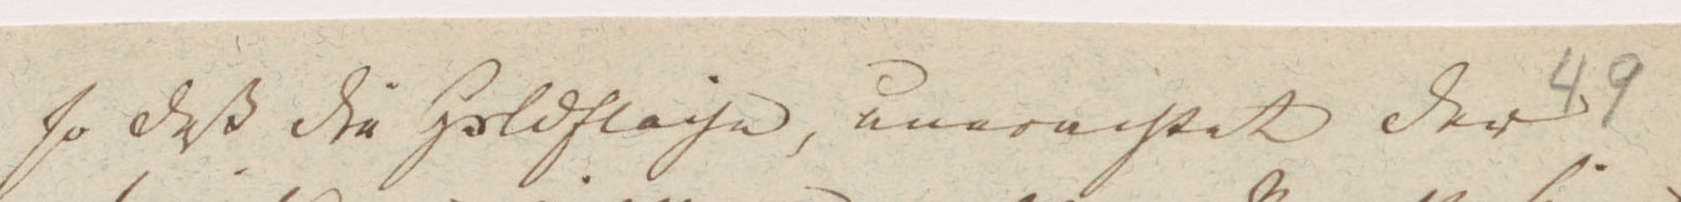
so dass die Goldfläche, unerachtet der
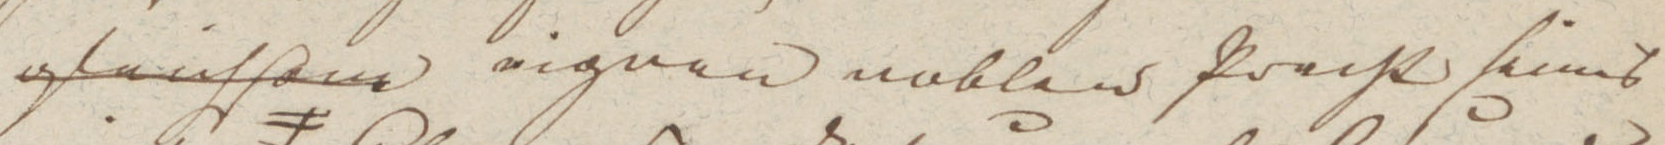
gleichsam eignen noblen Pracht seines
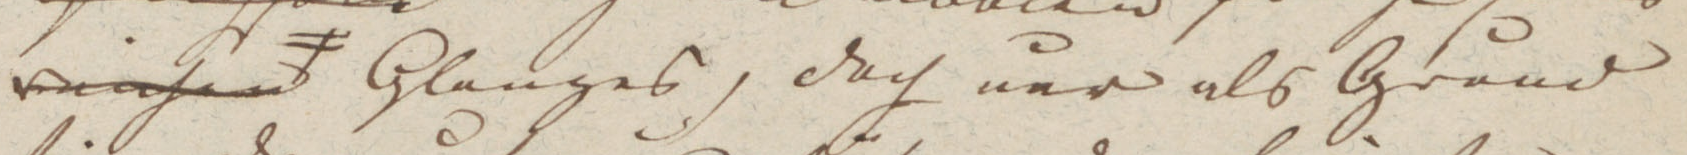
reichen % Glanzes, doch nur als Grund
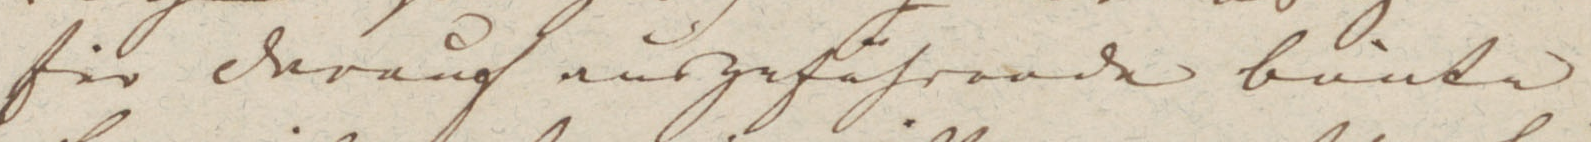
für darauf auszführende bunte
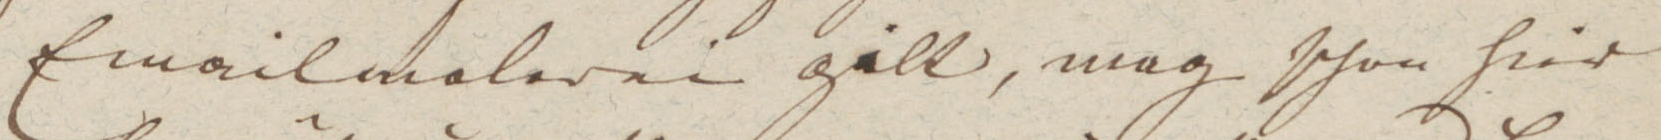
Emailmalerei gialt, mag schon hier
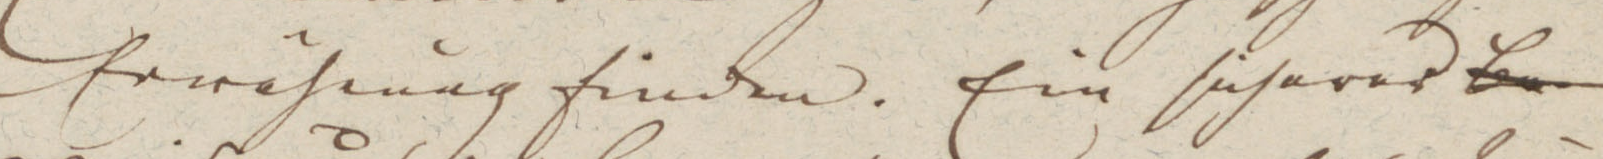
Erwähnung finden. Ein sicherer Be
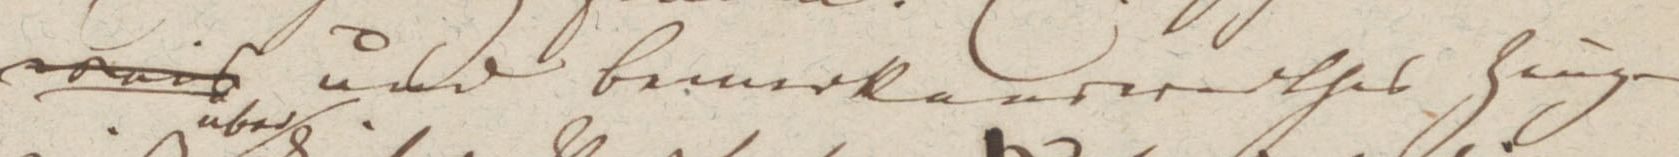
weis und bemerkenswerthes Zeug-
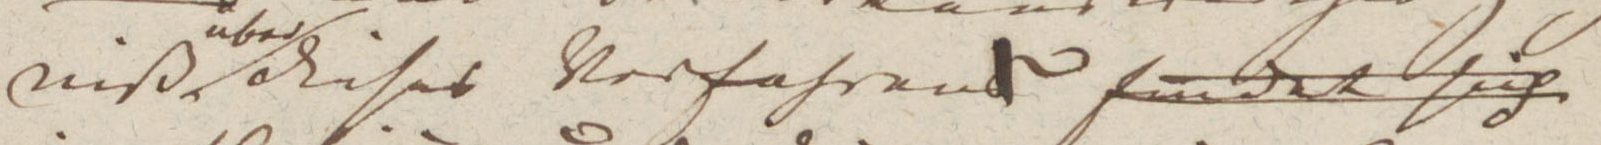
niss über dieses Verfahrens findet sich
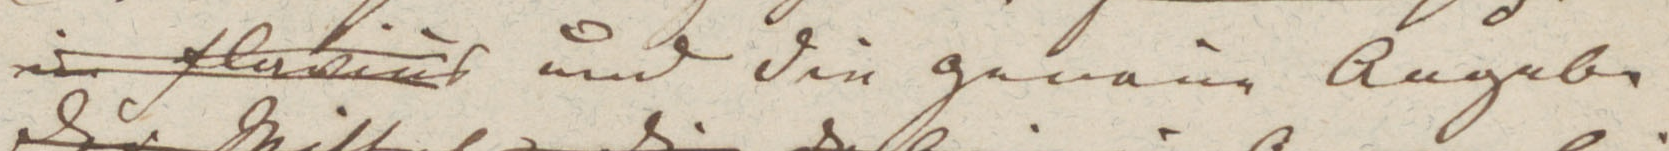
in Flavius und die genaue Angabe
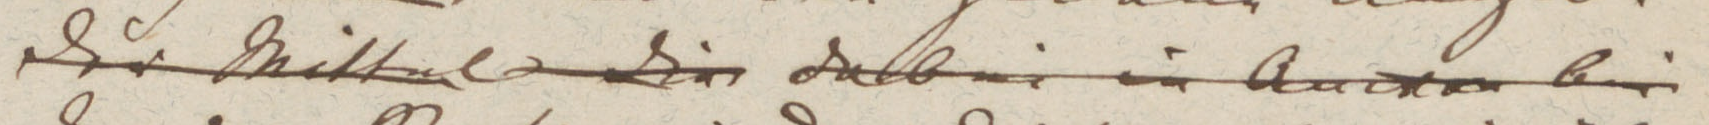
der Mittel die dabei in Anwen bei
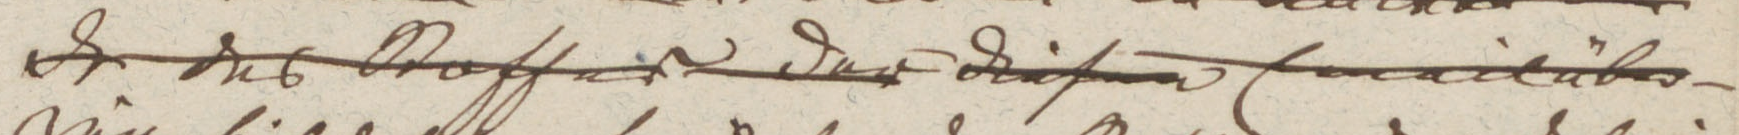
d des Stoffes der diesen Emailüber-
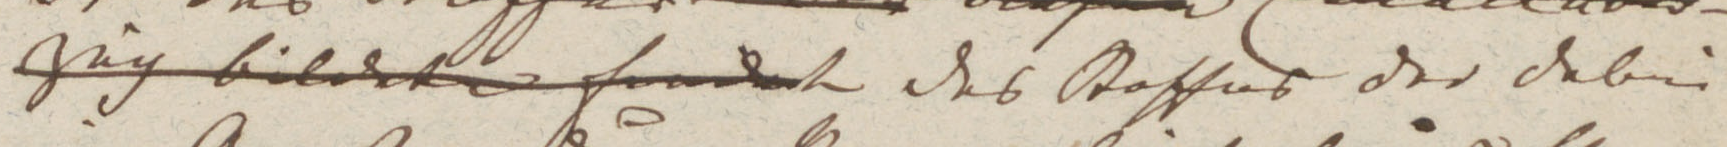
zug bildete findet des Stoffes der dabei
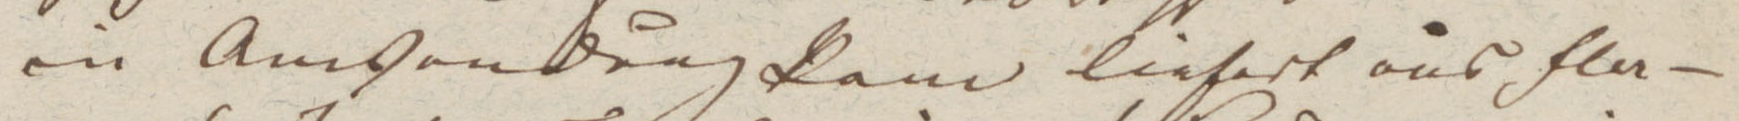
in Anwendung kam liefert uns Fla-
